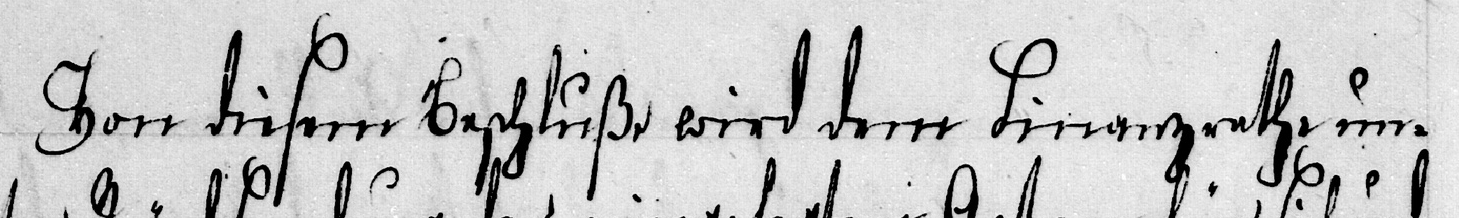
Von diesem Beschluße wird dem Finanzrathe un¬
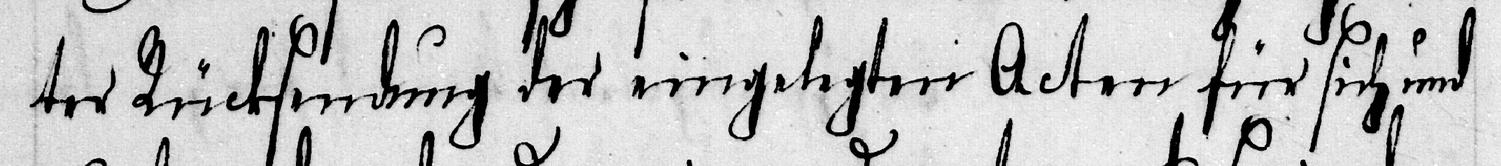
ter Rücksendung der eingelegten Acten für sich und
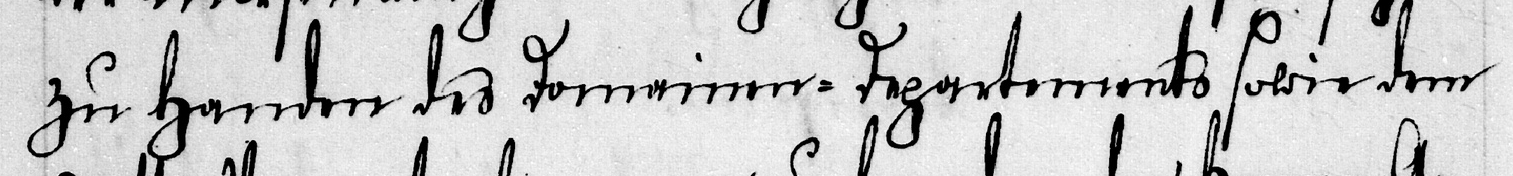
zu Handen des Domainen-Departements sowie dem
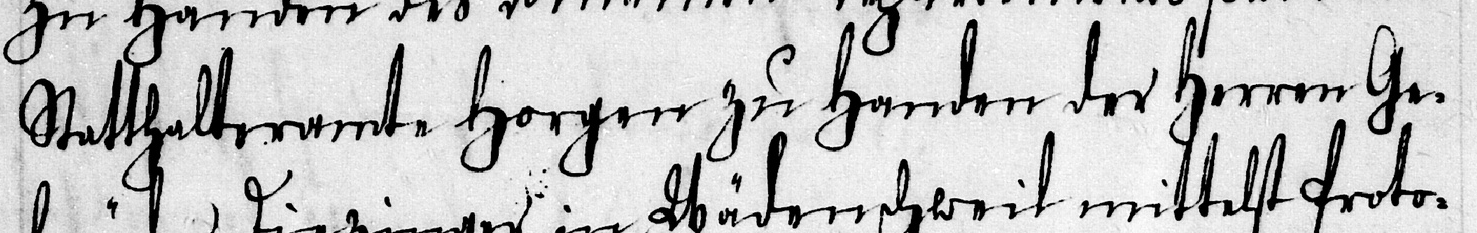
Statthalteramte Horgen zu Handen der Herren Ge¬
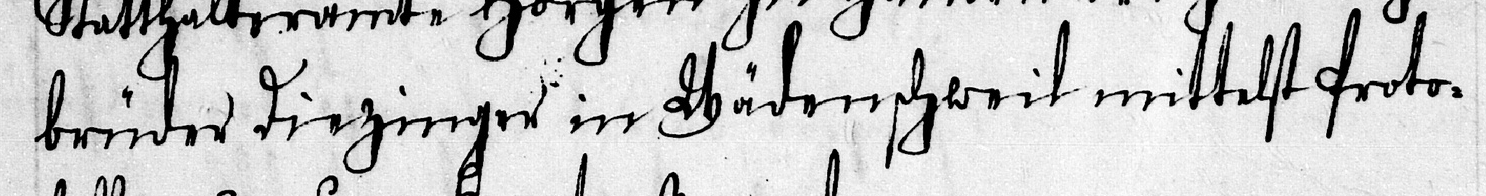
brüder Diezinger in Wädenschweil mittelst Proto¬
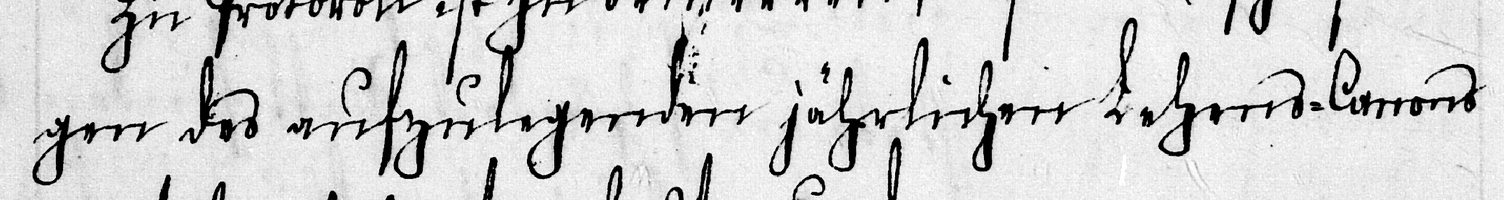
gen des aufzulegenden jährlichen Lehens-Canons
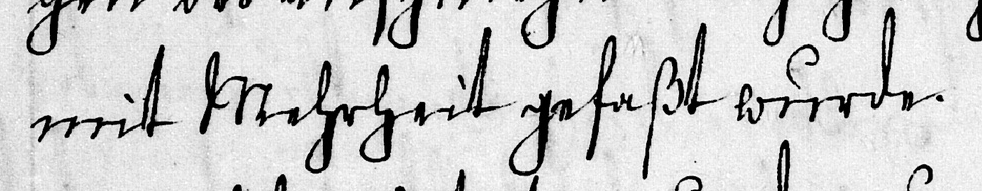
mit Mehrheit gefaßt wurde.
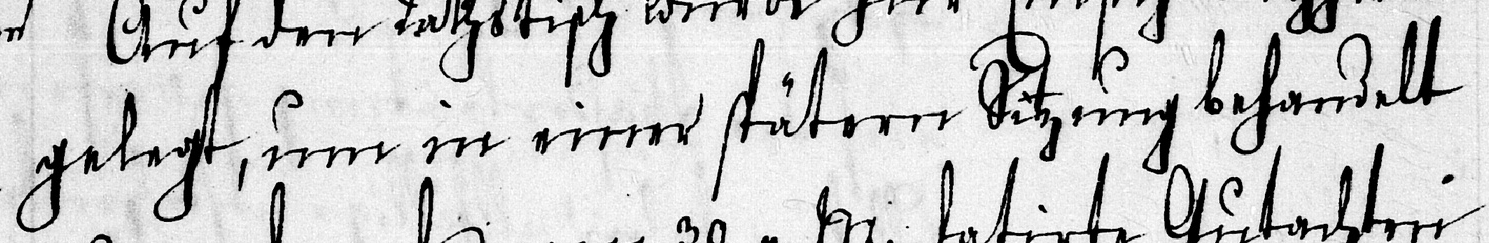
gelegt, um in einer spätern Sitzung behandelt
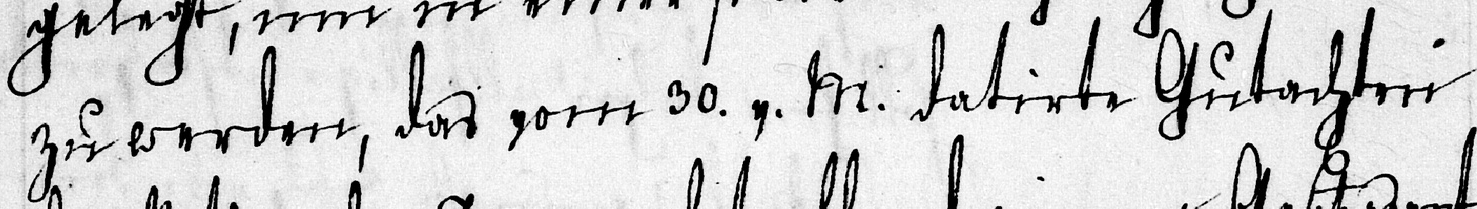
zu werden, das vom 30. v. M. datirte Gutachten
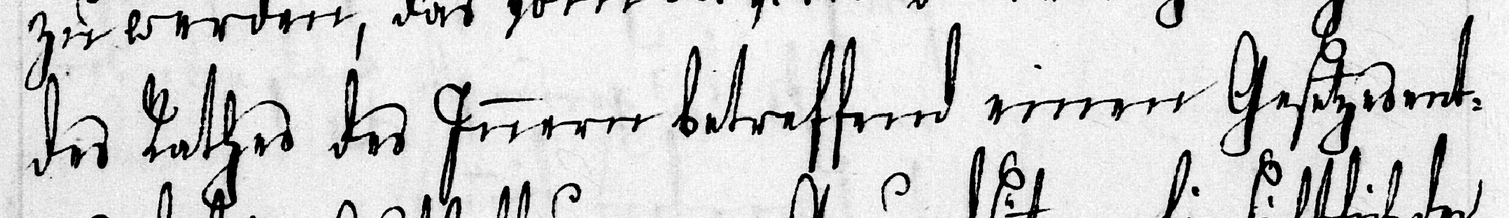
des Rathes des Innern betreffend einen Gesetzesent¬
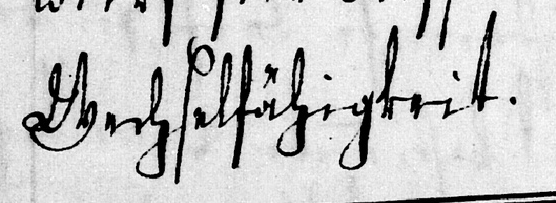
Wechselfähigkeit.
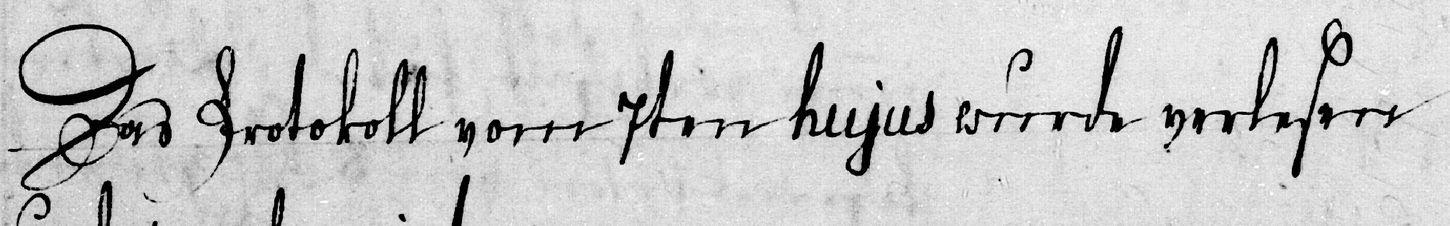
Das Protokoll vom 7ten hujus wurde verlesen
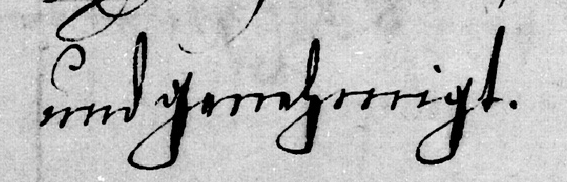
und genehmigt.
